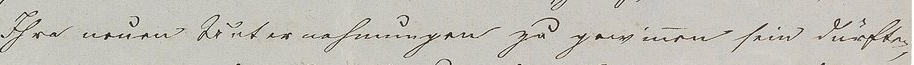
Ihre neuen Unternehmungen zu gewinnen sein dürften,
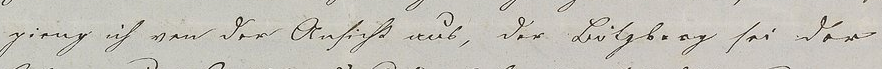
gieng ich von der Ansicht aus, der Bötzberg sei der
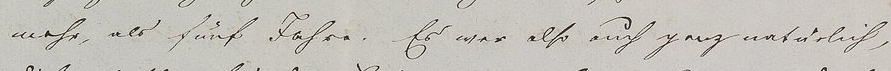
mehr als fünf Jahre. Es war also auch ganz natürlich,
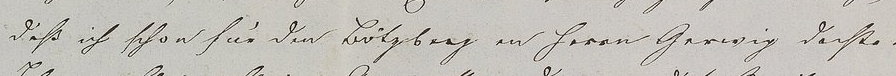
daß ich schon für den Bötzberg an Herrn Gerwig dachte.
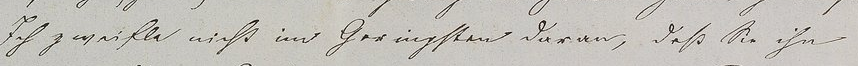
Ich zweifle nicht im Geringsten daran, daß Sie ihn
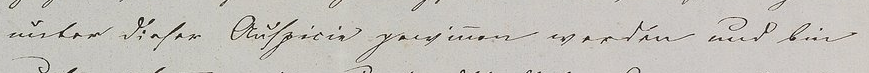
unter dieser Auspicie gewinnen werden und bin
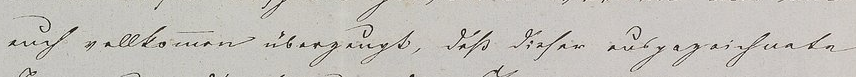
auch vollkommen überzeugt, daß dieser ausgezeichnete
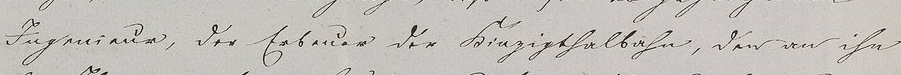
Ingenieur, der Erbauer der Kinzigthalbahn, den an ihn
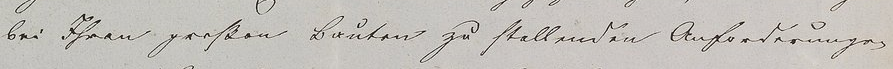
bei Ihren großen Bauten zu stellenden Anforderungen
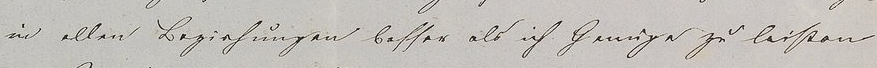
in allen Beziehungen besser als ich Genüge zu leisten
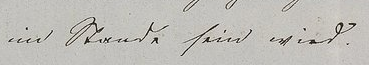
im Stande sein wird.
